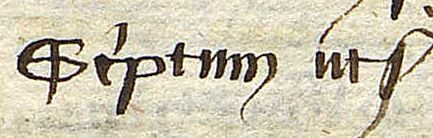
Sc*ptum ut ſ*
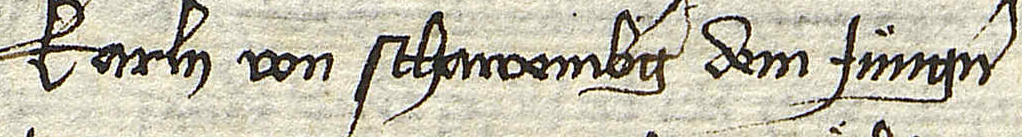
Karln von ſchawemb*g dem Iüng*n
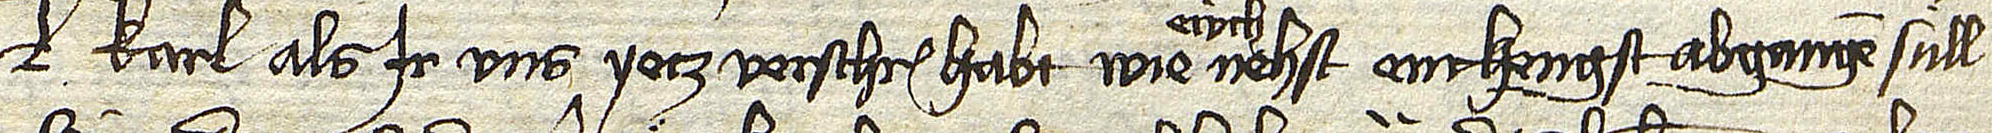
L* Karl als Ir vns yecʒ verſchr* habt wie nehſt ein hengſt abgange* ſüll
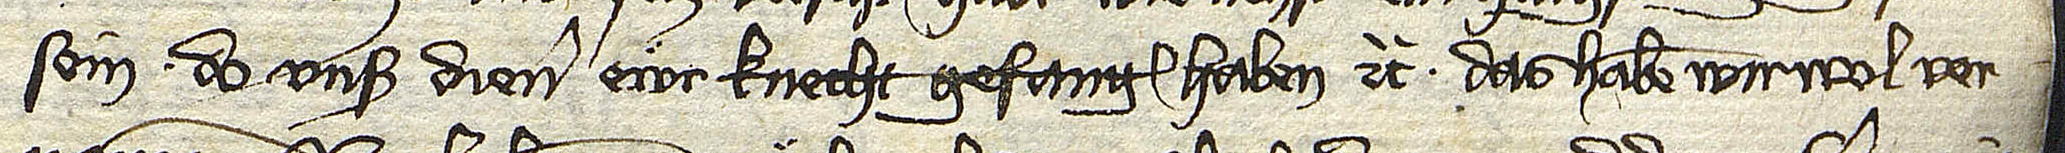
ſein . do vnſ* dien* ewr knecht gefang* haben ec* . das habe* wir wol ver -
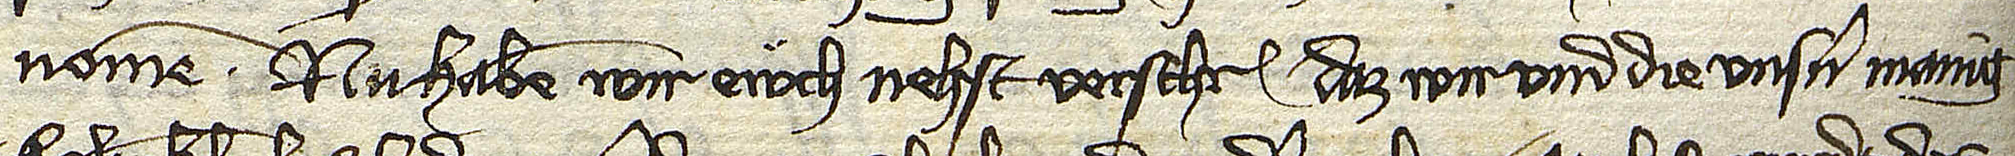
nome* . Nu habe* wir ewch nehſt verſchr* / daʒ wir vnd die vnſ*n manig -
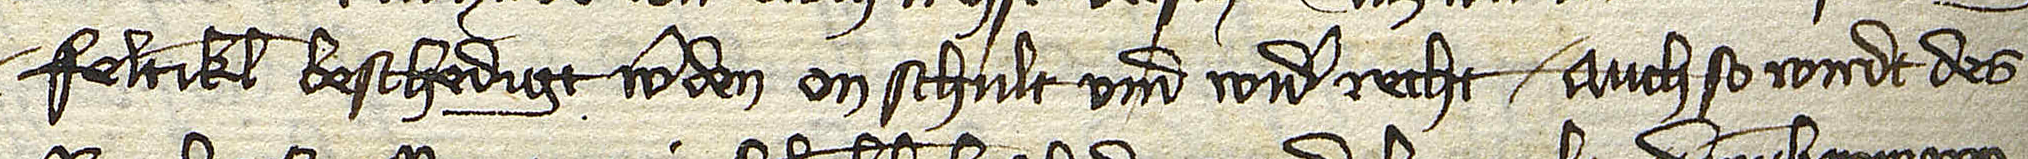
feltikl* beſchedigt w*den on ſchult vnd wid* recht / auch ſo wirdt des
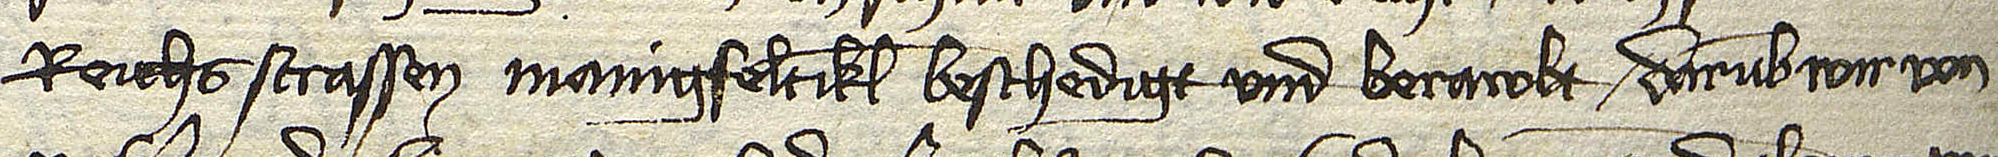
Reichs ſtraſſen manigfeltikl* beſchedigt vnd berawbt / Daru*b wir von
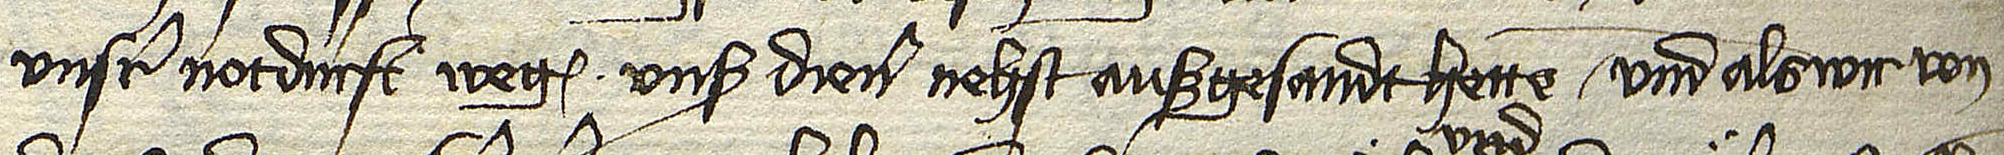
vnſ*r notdurft weg* . vnſ* dien* nehſt auſʒgeſandt hette* / vnd als wir von
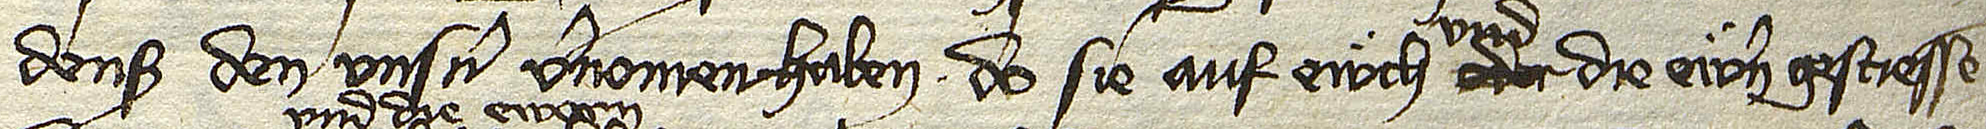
denſ* den vnſ*n v*nomen haben . do ſie auf ewch oder die ew*n geſieſſe*
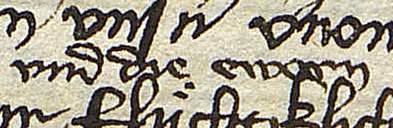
vnd die ewern
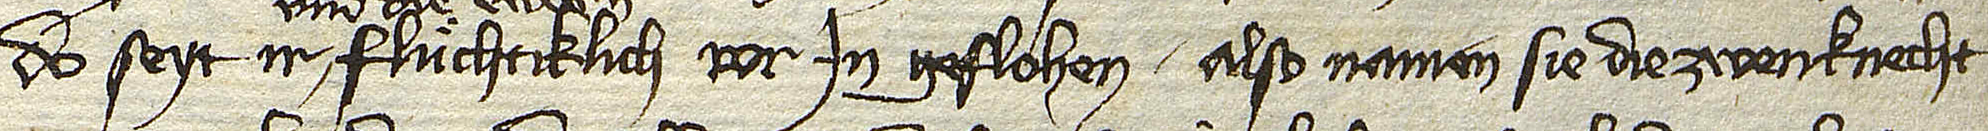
do ſeyt ir flüchtiklich vor In geflohen / alſo namen ſie die ʒwen knecht
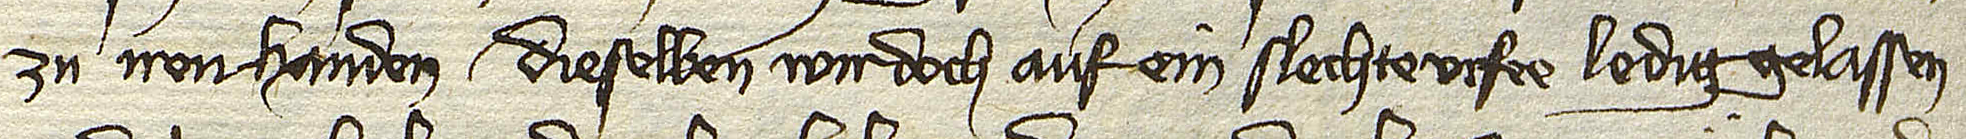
ʒu iren handen / dieſelben wir doch auf ein ſlechte vrfee ledig gelaſſen
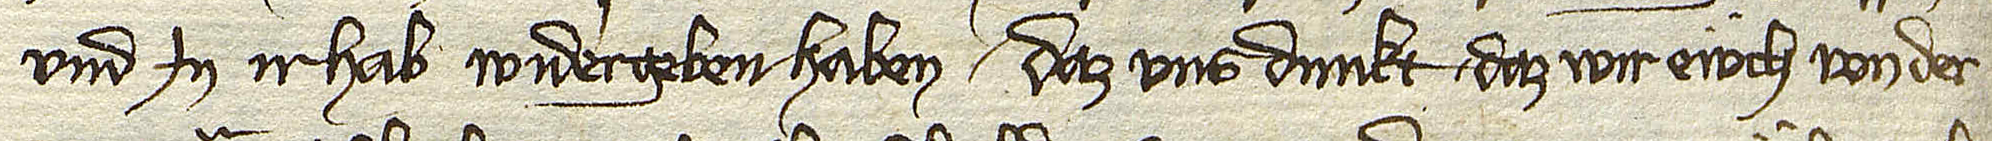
vnd In ir hab widergeben haben / daʒ vns dunkt / daʒ wir ewch von der
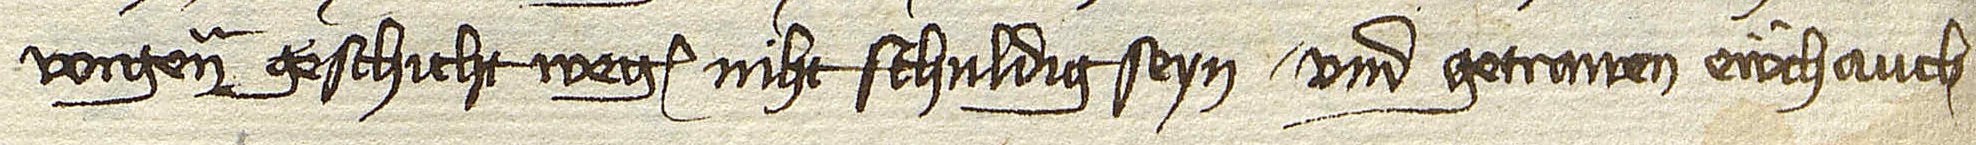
vorgen* geſchicht weg* niht ſchuldig ſeyn / vnd getrawen ewch auch
